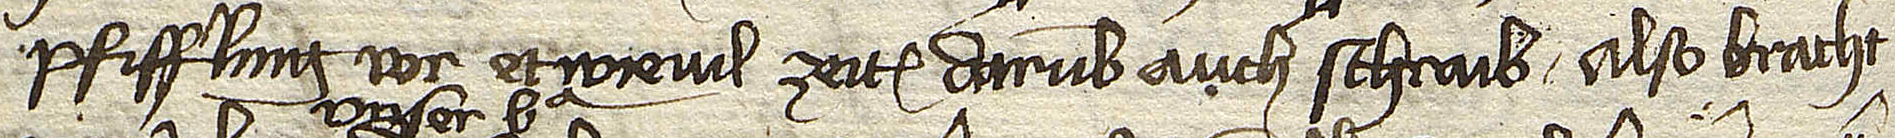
pfiff*ling vor etwieuil ʒeit* darub* auch ſchraib / Alſo bracht
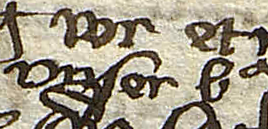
vnſer b*
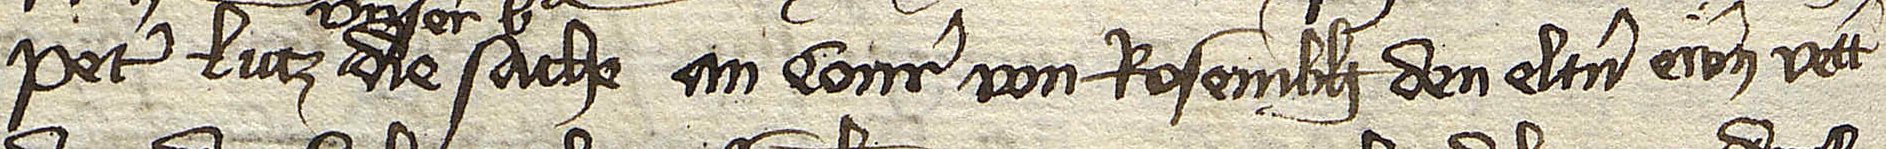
Pet* lutʒ die ſache an Conr* von Roſemb*g den eltn* eẅ*n vett*
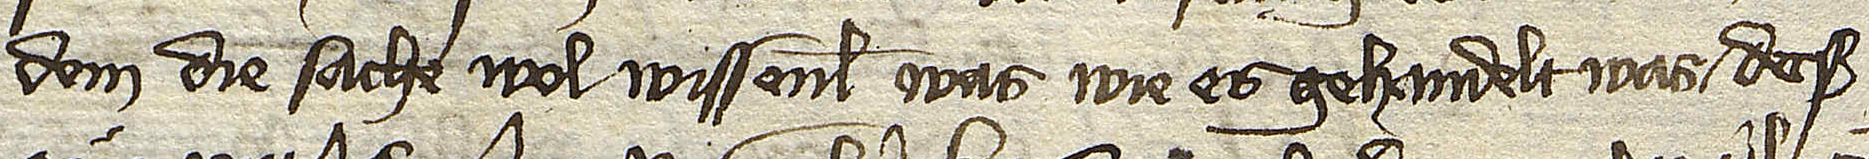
dem die ſache wol wiſſenl* was wie es gehandelt was / derſ*
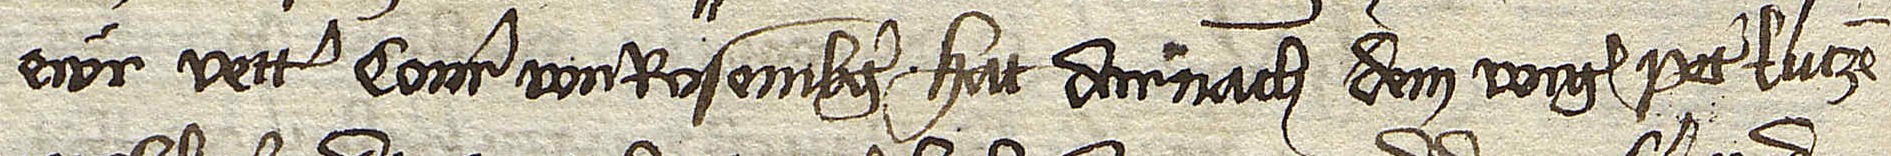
eẅr vett* Conr* von Roſemb*g hat darnach dem vorg* Pet* lucʒe*
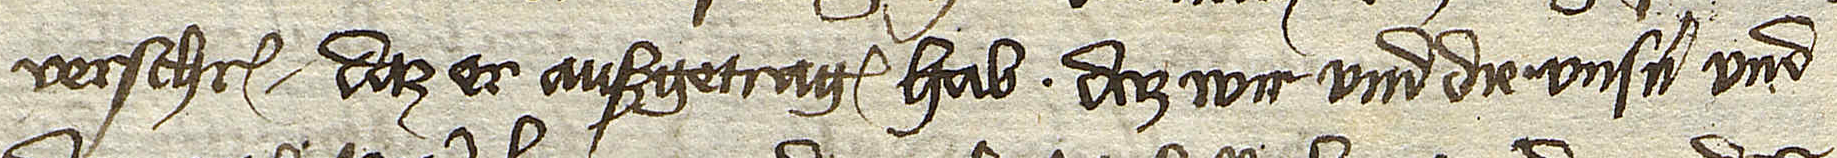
verſchr* / daʒ er auſʒgetrag* hab . daʒ wir vnd die vnſn* vnd
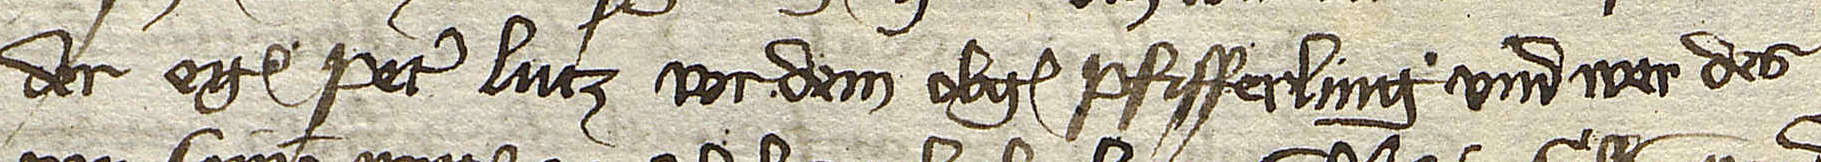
der eg* Pet* lucʒ vor dem obg* pfifferling vnd wer des
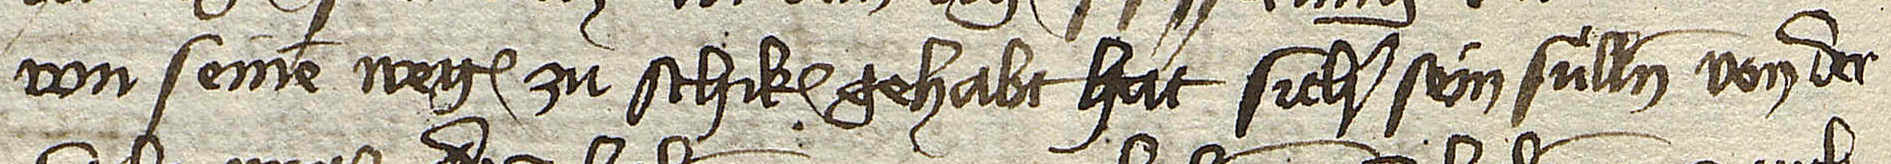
von ſeine* weg* ʒu ſchik* gehabt hat ſich* ſein ſülln* von der
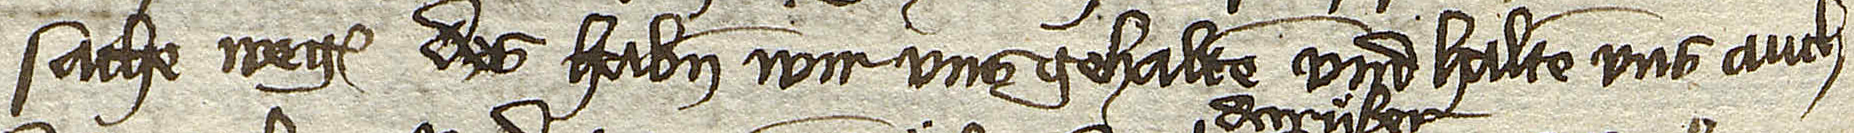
ſache weg* des habn* wir vns gehalte* vnd halte* vns auch
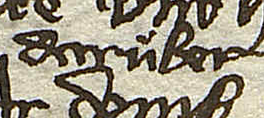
darüber
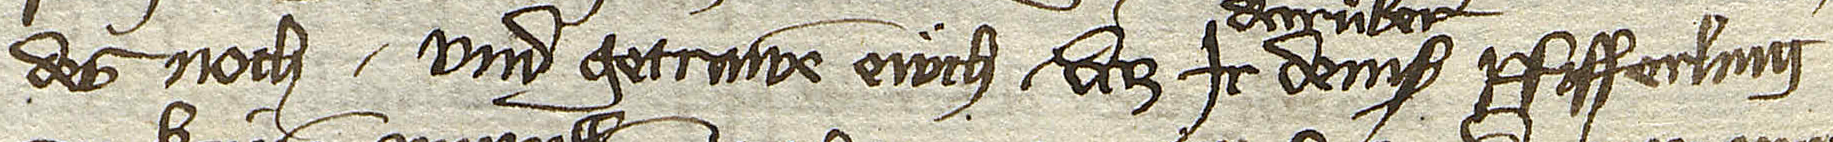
des noch / vnd getrawe* eẅch / daʒ Ir demſ* Pfifferling
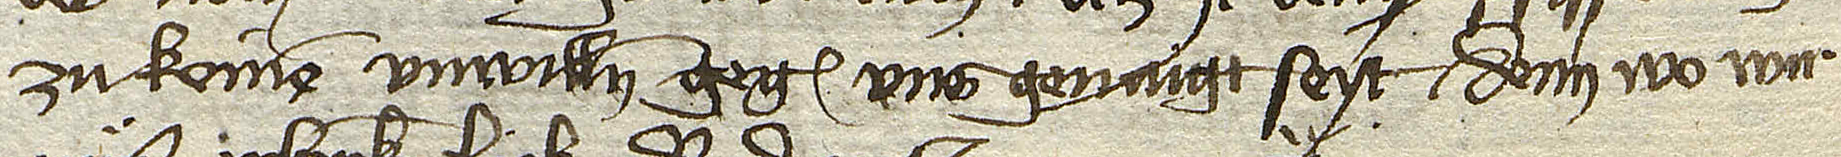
ʒu keine* vnwilln* geg* vns genaigt ſeyt / Denn wo wir
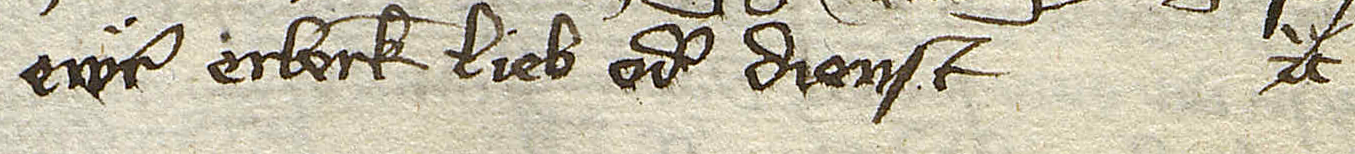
eẅr* erberk* lieb od* dienſt ec*
